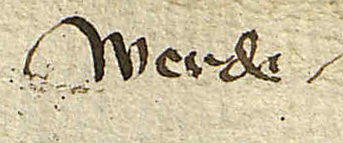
Werde /
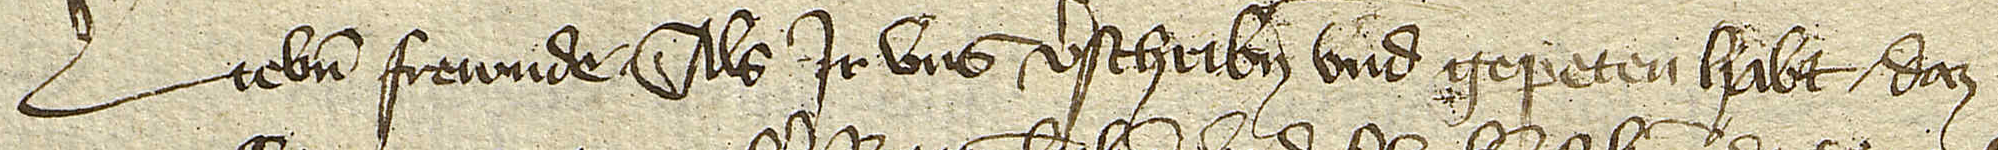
Liebn* frewnde / Als Ir vns v*ſchribn* vnd gepeten habt / daʒ
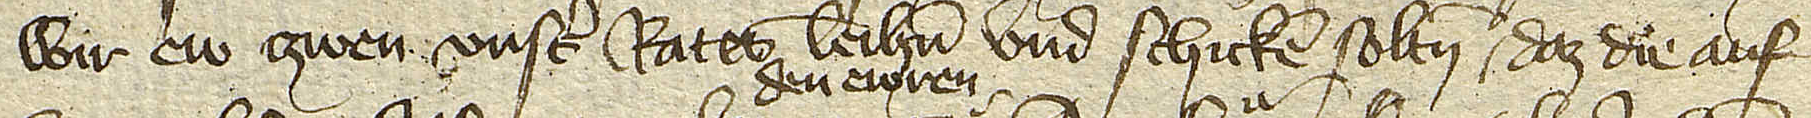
wir ew cʒwen vnſs* Rates leihn* vnd ſchicke* ſoltn* / daʒ die auf
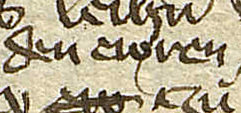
den ewren
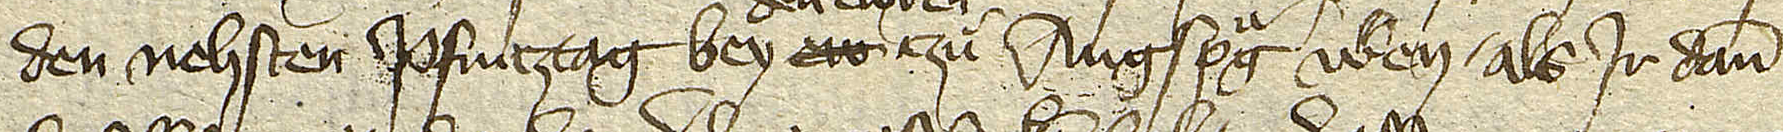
den nehſten Pfincʒtag bey ew cʒü Augſp*g w*en / als Ir dan*
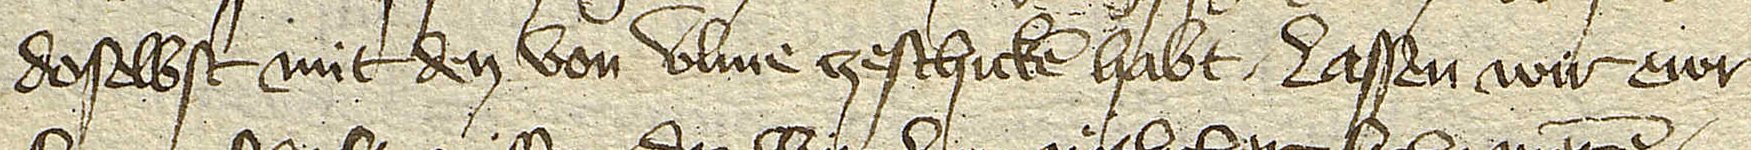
doſelbſt mit den von Vlme cʒeſchicke* habt / Laſſen wir ewr
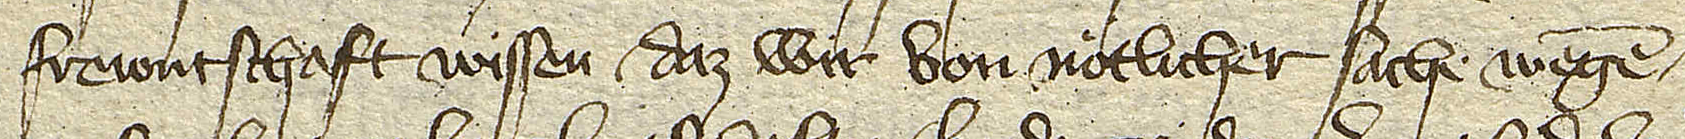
frewntſchaft wiſſen / daʒ wir von nötlicher ſache wege* /
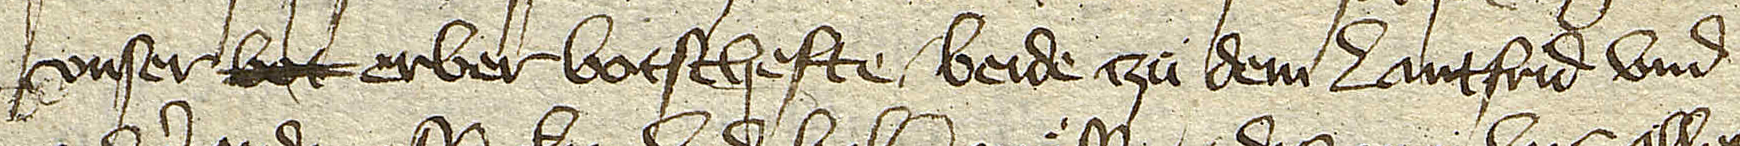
vnſer bot erber botſchefte / beide cʒü dem Lantfrid vnd
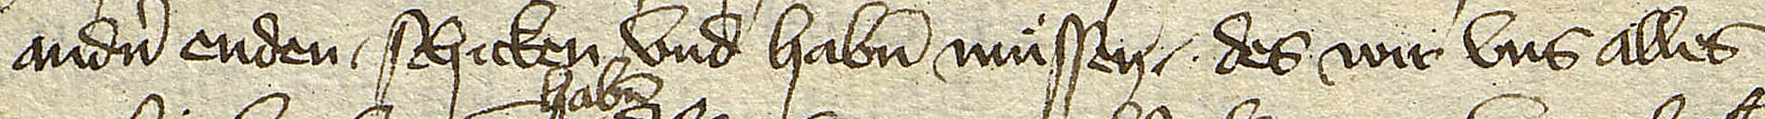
andn* enden / ſchicken vnd habn* müſſen / des wir vns alles
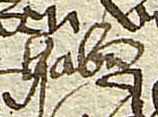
habn*
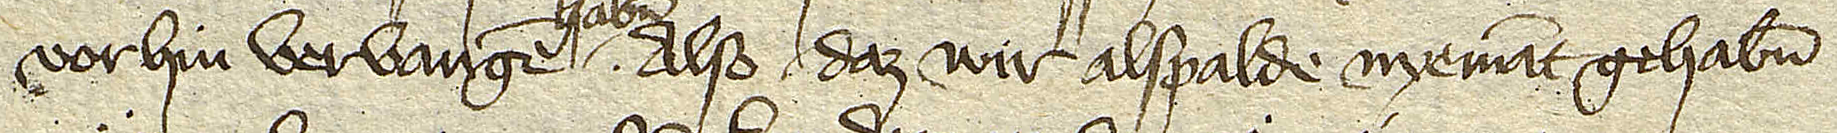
vorhin vervange* / . Alſo / daʒ wir alſpalde nyemat* gehabn*
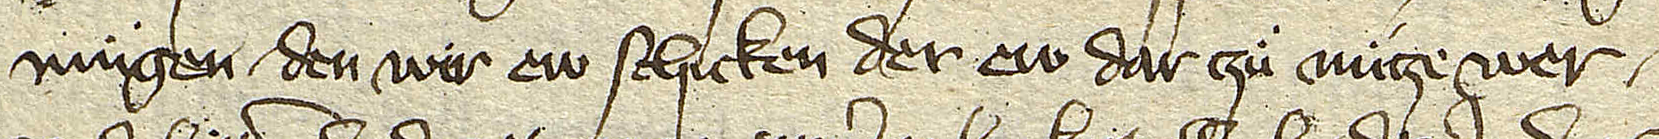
mügen / den wir ew ſchicken der ew dar cʒü nücʒe wer /
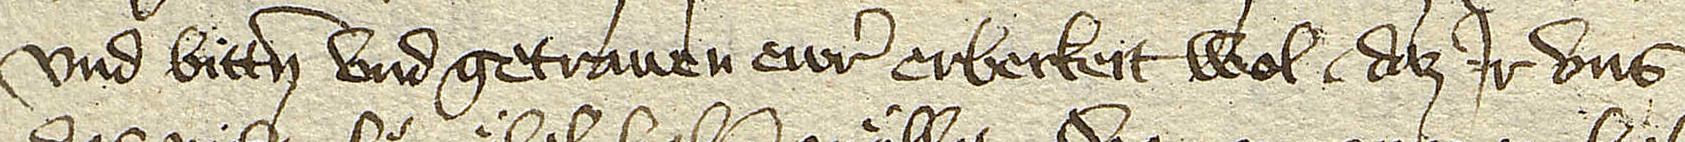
vnd bittn* vnd getrawen ewr* erberkeit wol / daʒ Ir vns
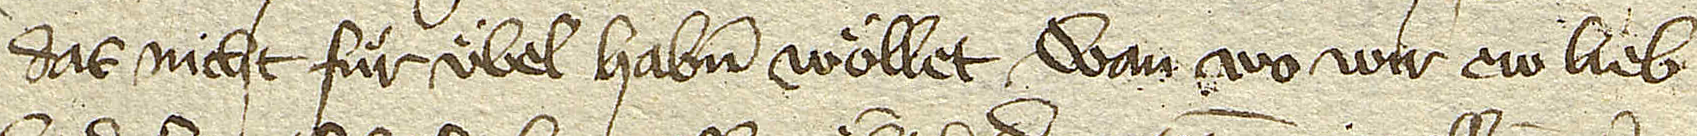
das nicht für v̈bel habn* wöllet / wan wo wir ew lieb
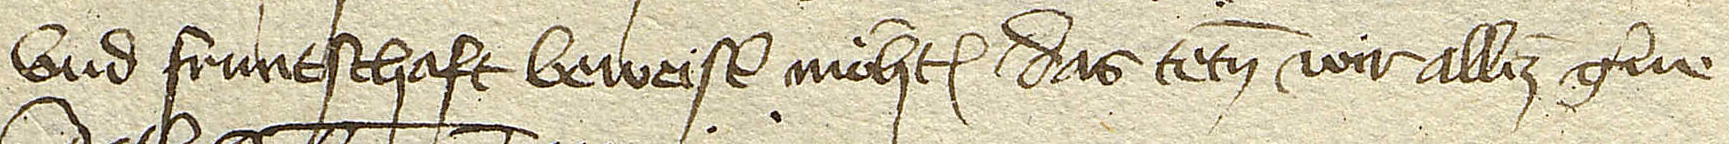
vnd fruntſchaft beweiſe* möht* / das tetn* wir allcʒ* g*ne
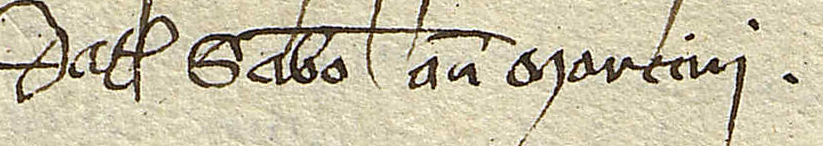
Dat* Sabo* an* Martini .
